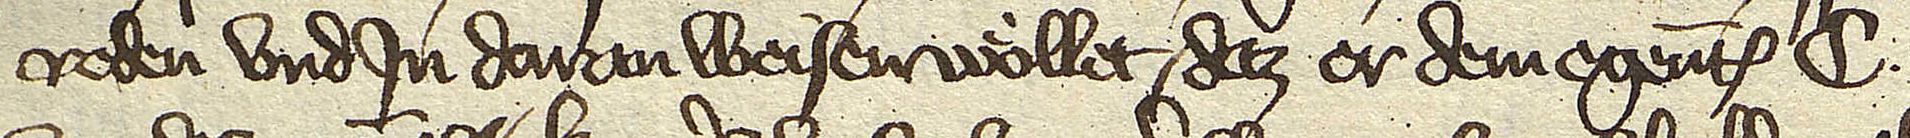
reden vnd In daran weiſen wöllet / daʒ er dem egent* C .
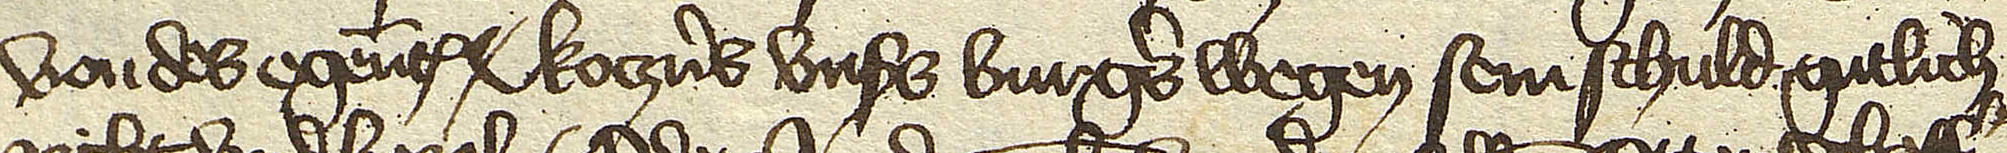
von des egent* C kocʒn*s vnſ*s burg*s wegen ſein ſchuld gutlich
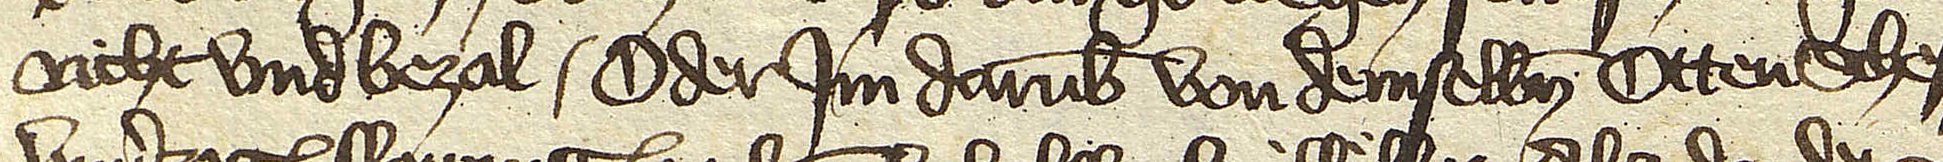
richt vnd beʒal / Oder Im darub* von demſelbn* Otten Scheff*
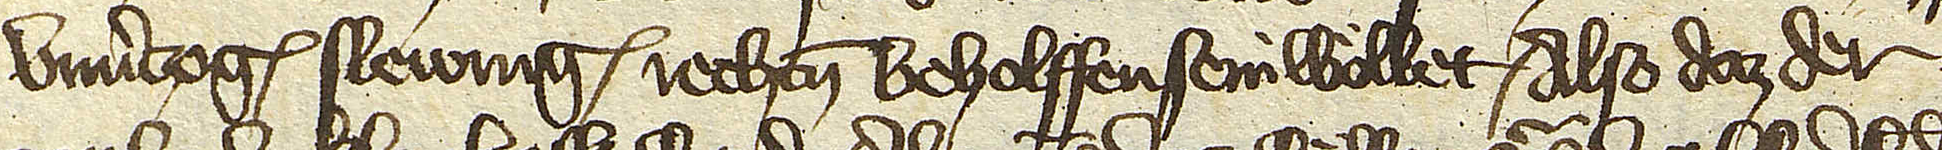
vnu*cʒog* ſlewnig* rechtn* beholffen ſein wöllet / Alſo daʒ der
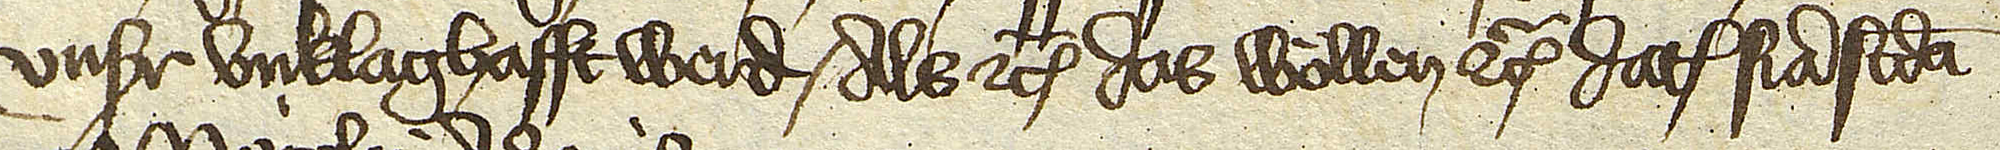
vnſ*r vnklaghafft werd / Als ec* das wöllen ec* dat* fia* ſcda*
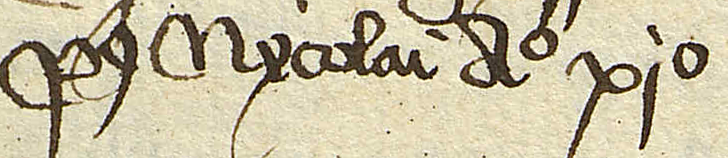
p* Nycolai A* xi*
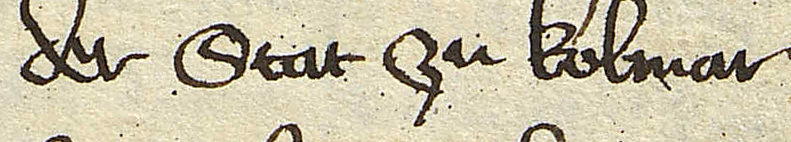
der Stat cʒu Kolmar
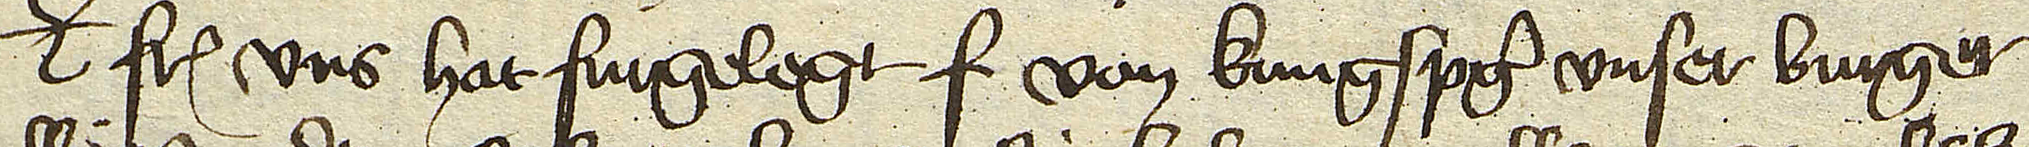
L* fr* vns hat furgelegt f von kungſpg* vnſer burger
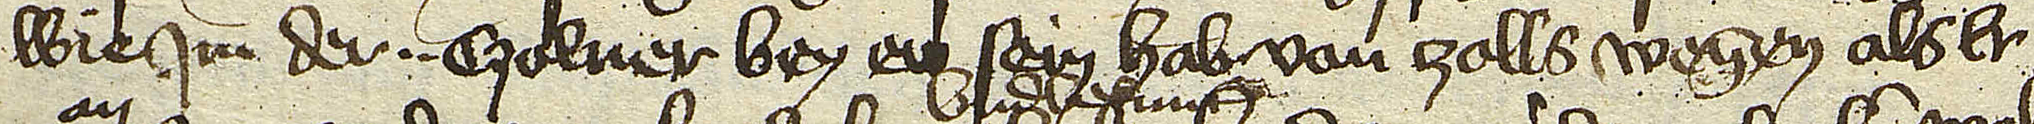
wie Im der ~ Cʒolner bey ew ſein hab von cʒolls wegen als Er
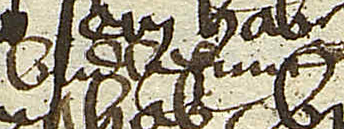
vnd be%%%%
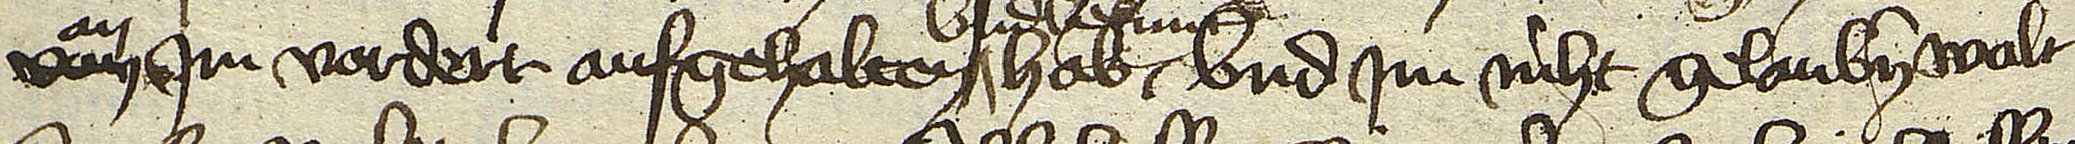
von Im vordert aufgehalten hab / vnd Im niht gelaubn* wolt
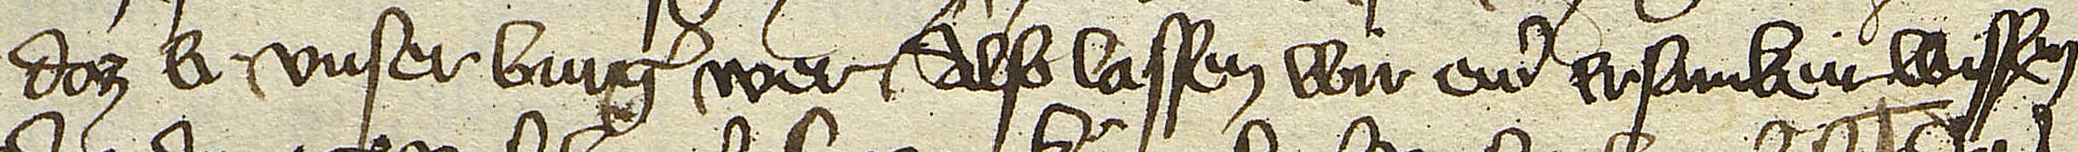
daʒ Er vnſer burg* wer / Alſo laſſen wir ew* Erſamkeit wiſſen
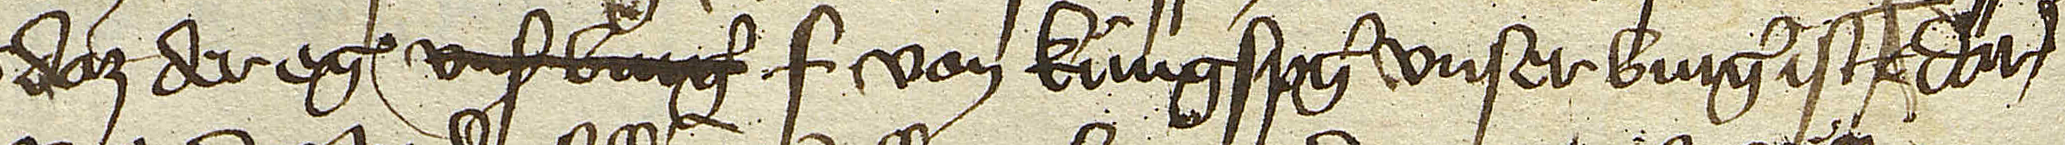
daʒ der eg* vnſ* burg* f von küngſpg* vnſer burg* iſt / dar*
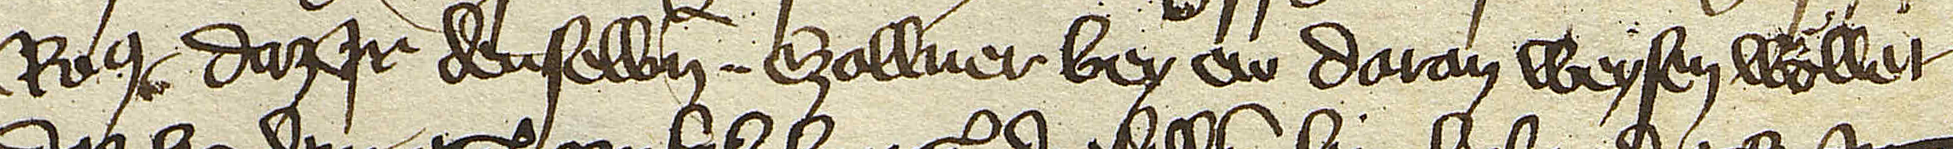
Ro* / daʒ Ir denſelbn* ~ Cʒollner bey ew daran weyſen wöllet
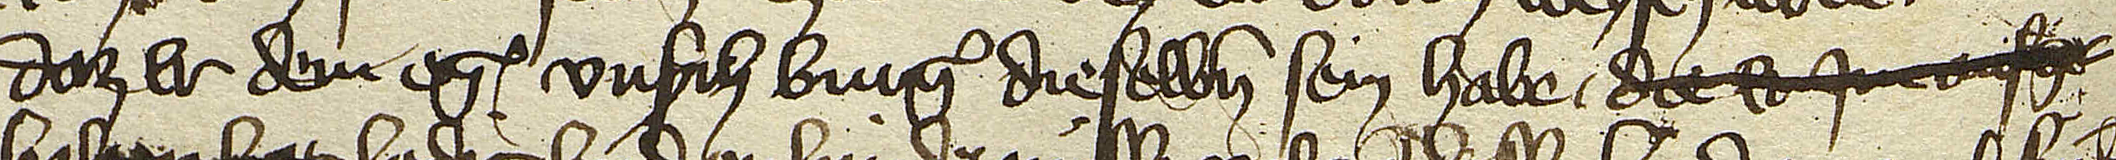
daʒ Er dem eg* vnſ*ih burg* dieſelbn* ſein habe / die Er Im auſge=
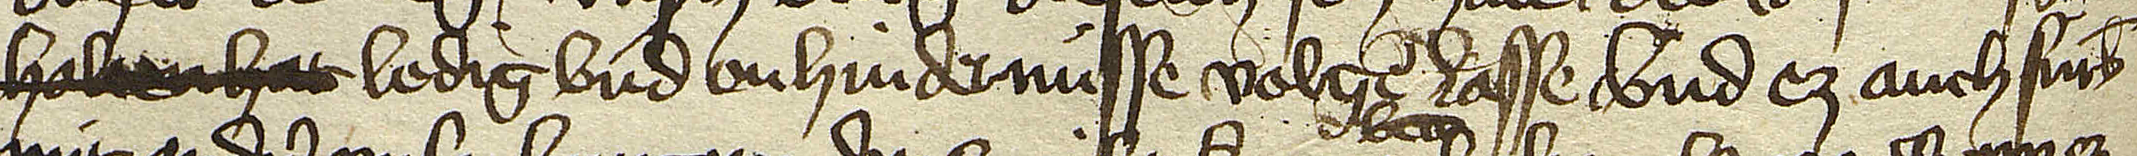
halten hat ledig vnd onhindernüſſe volge* laſſe / vnd eʒ auch fürb*
